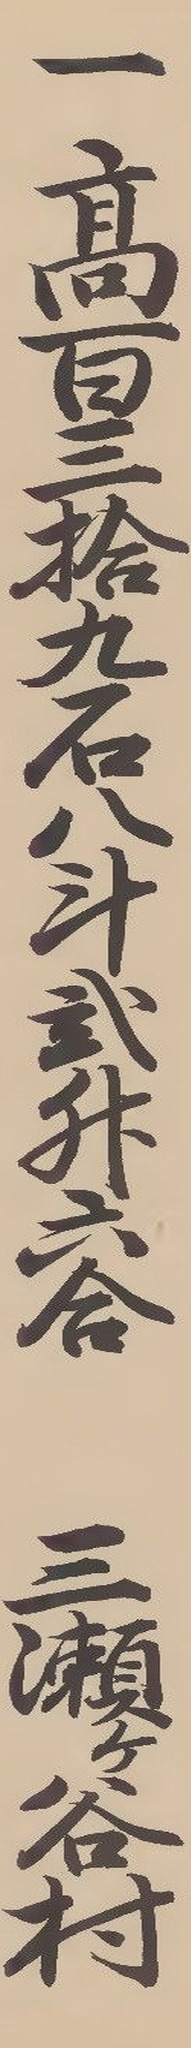一高百三拾九石八斗弐升六合三瀬ヶ谷村
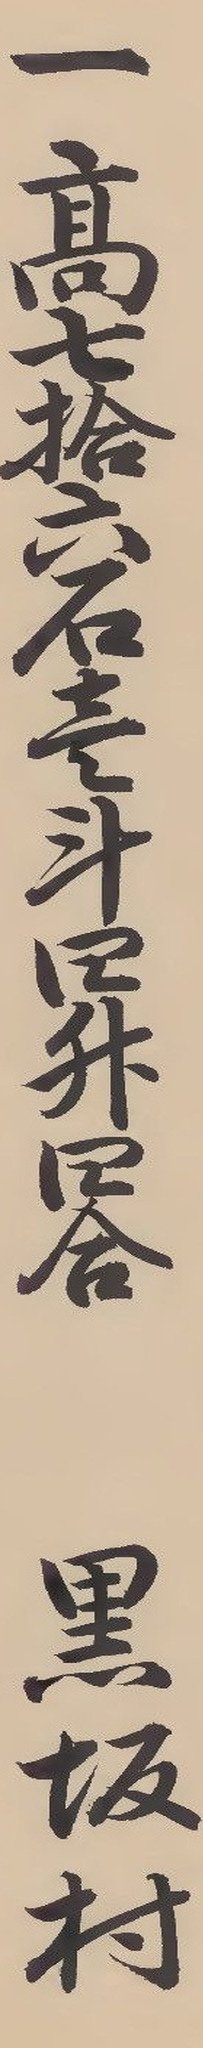一高七拾六石壱斗四升四合黒坂村
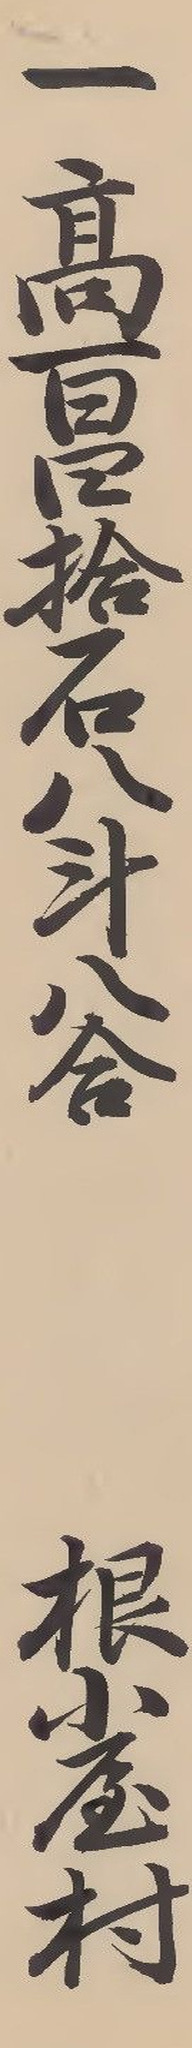一高百四拾石八斗八合根小屋村
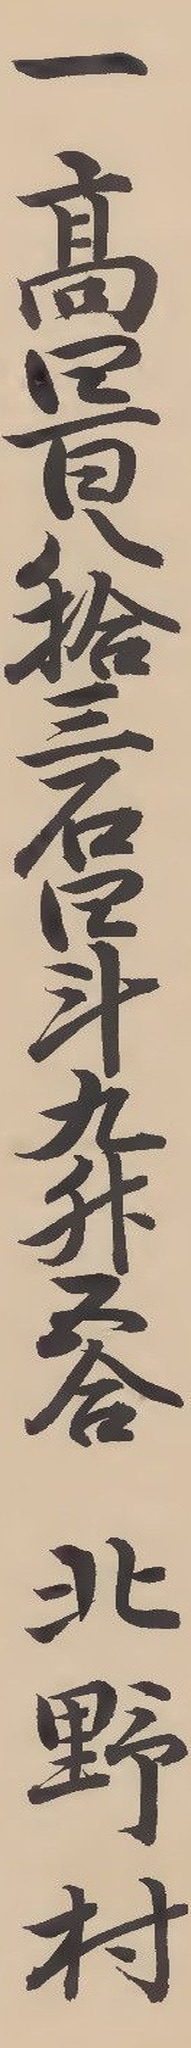一高四百八拾三石四斗九升五合北野村
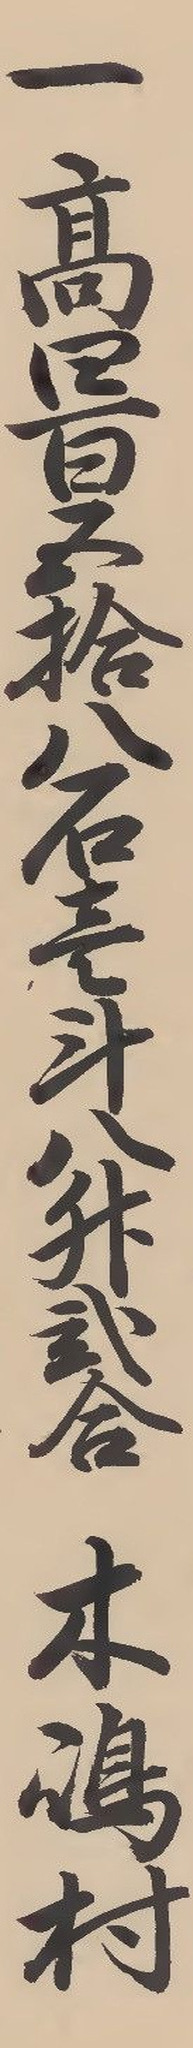一高四百五拾八石壱斗八升弐合木島村

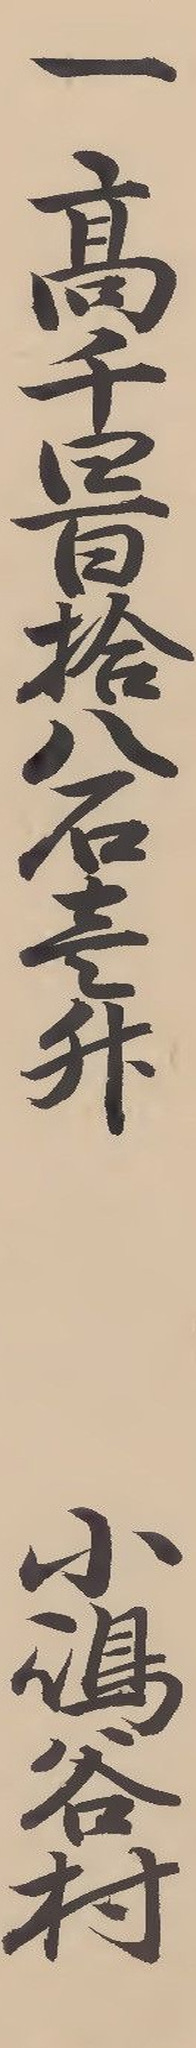一高千四百拾八石壱升小島谷村
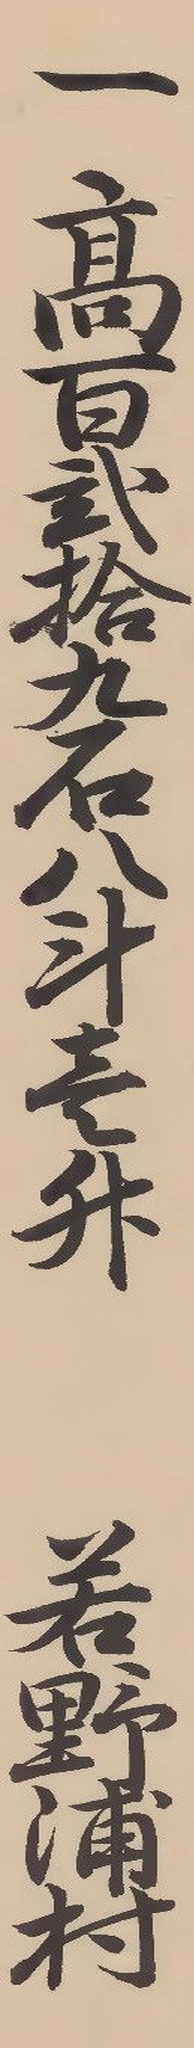一高百弐拾九石八斗壱升若野浦村
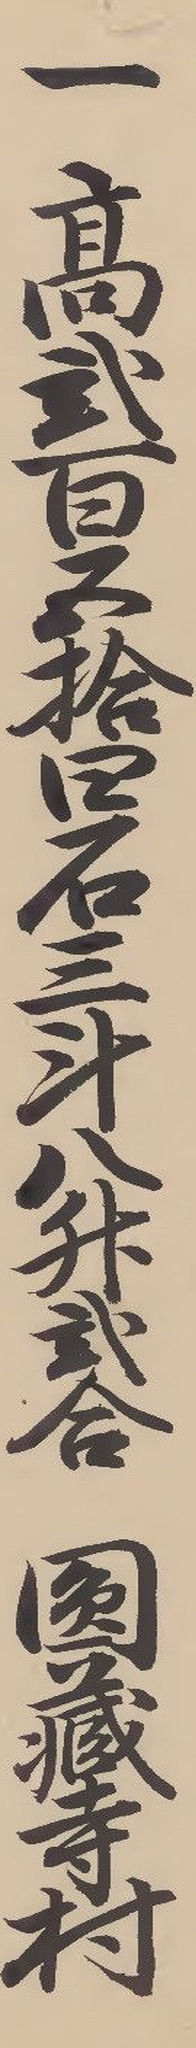一高弐百五拾四石三斗八升弐合円蔵寺村
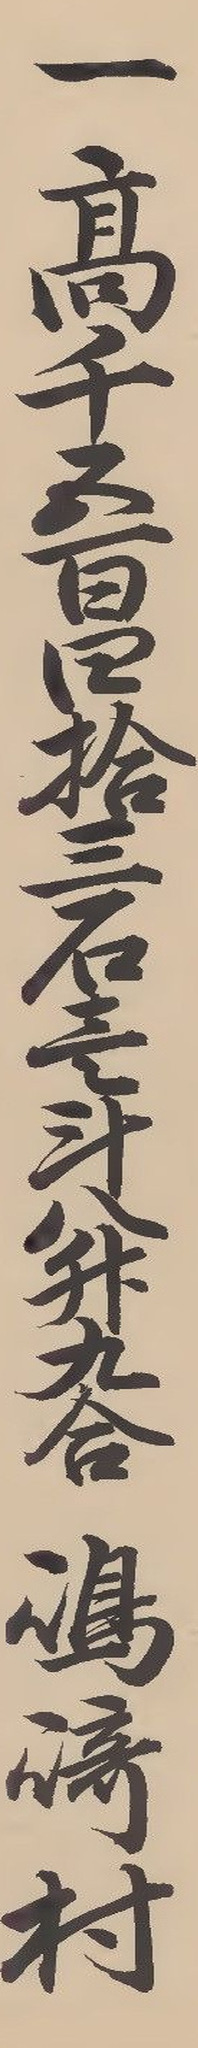一高千五百四拾三石壱斗八升九合島崎村
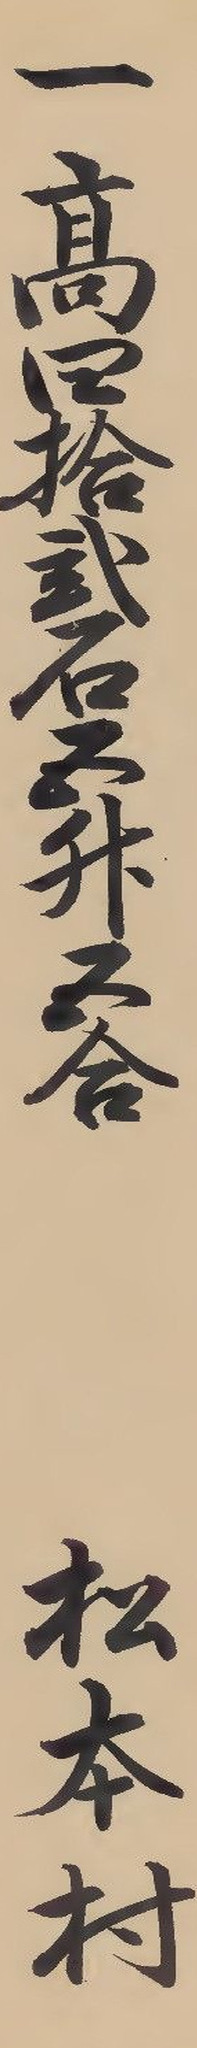一高四拾弐石五升五合松本村
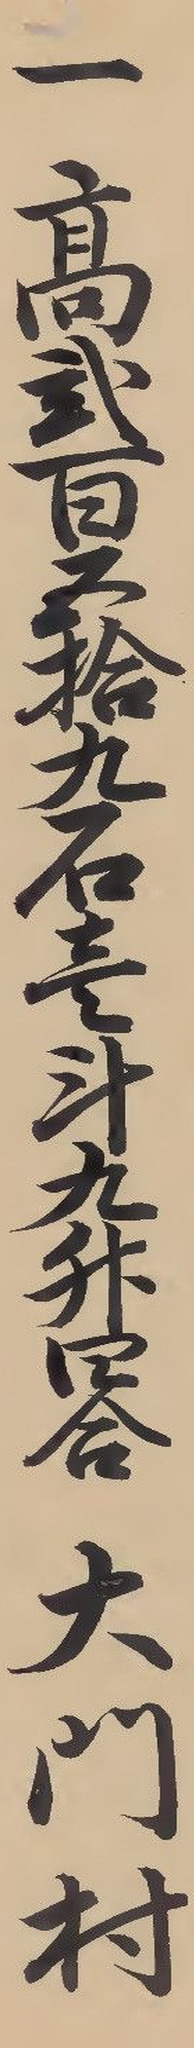一高弐百五拾九石壱斗九升四合大門村
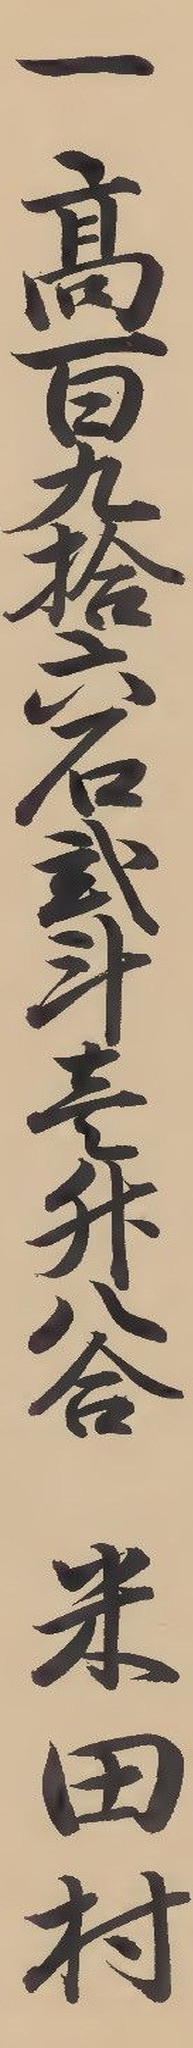一高百九拾六石弐斗壱升八合米田村
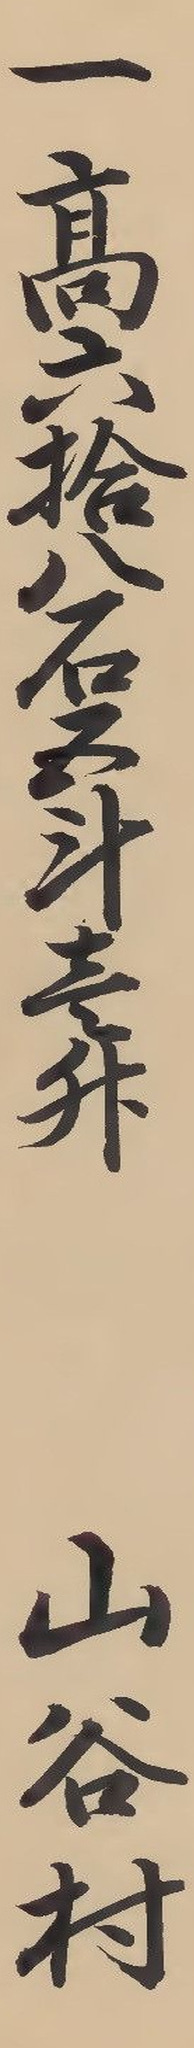一高六拾八石五斗壱升山谷村

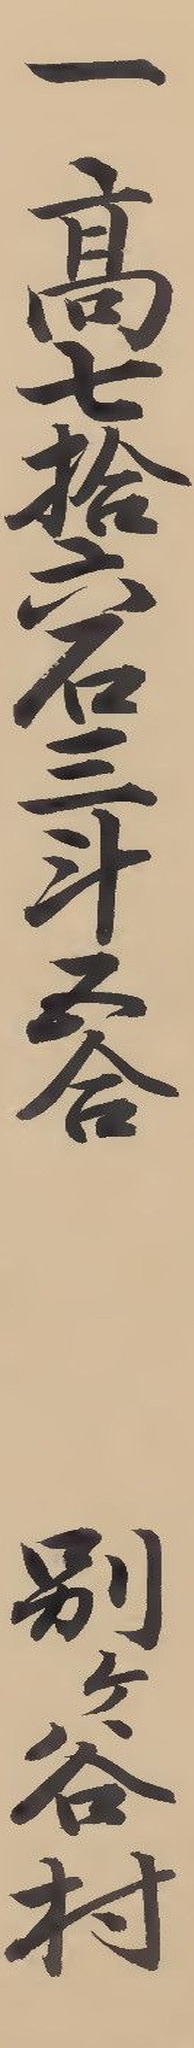一高七拾六石三斗五合別ヶ谷村
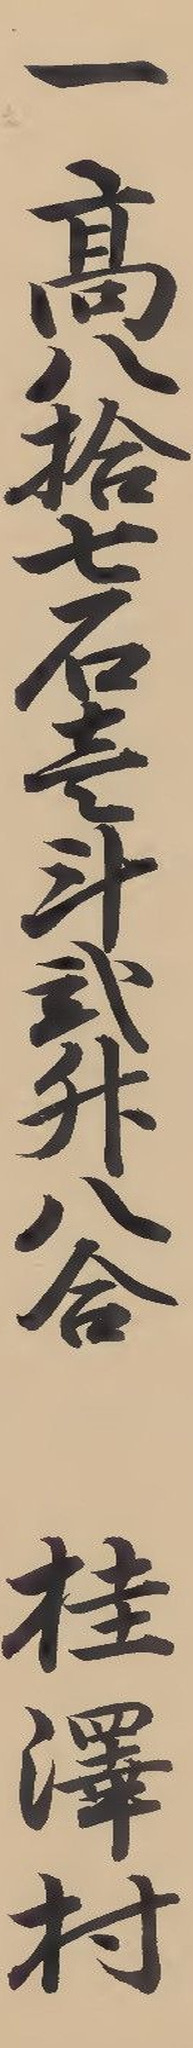一高八拾七石壱斗弐升八合桂沢村
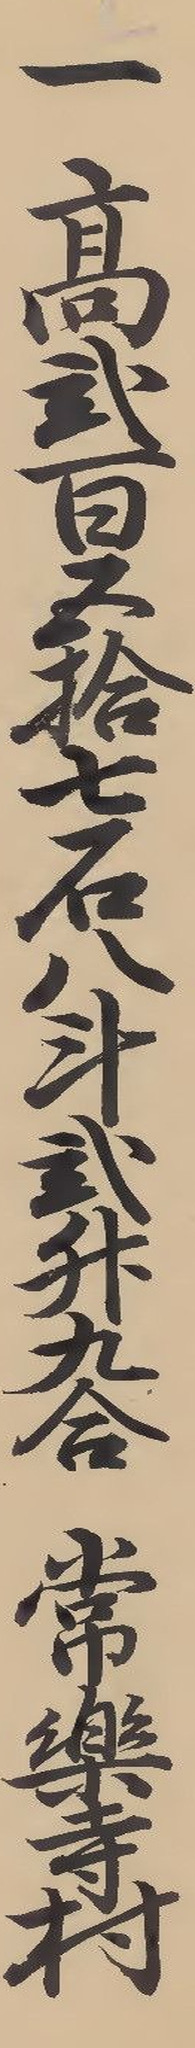一高弐百五拾七石八斗弐升九合常楽寺村
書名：越後国郷帳　中
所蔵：国立公文書館 National Archives of Japan
